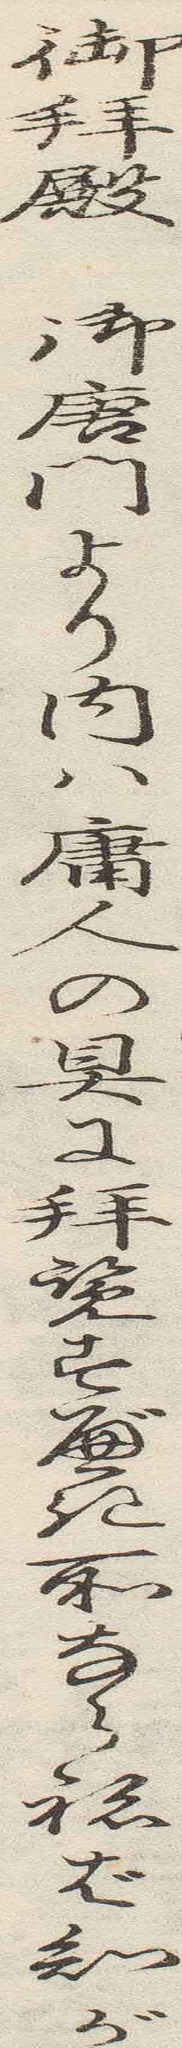御拜殿御唐門より内は庸人の具に拜覧すべき所ならねば知が
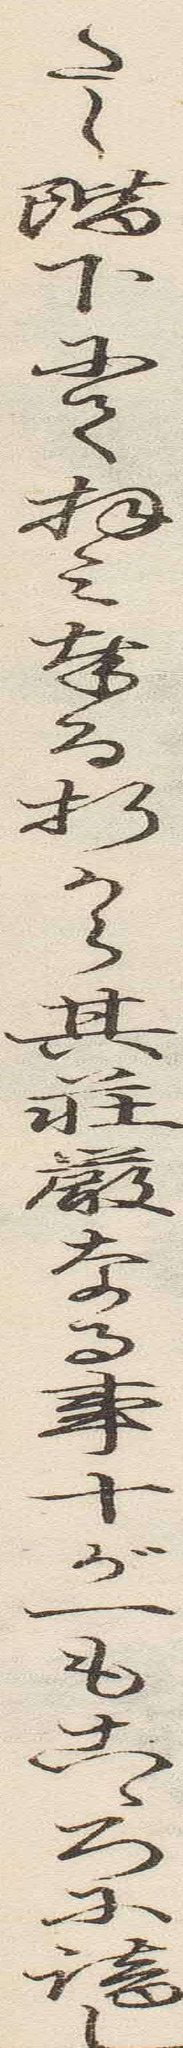たし階下にて拝み奉る折から其荘厳なる事十が一もこゝろに諳し
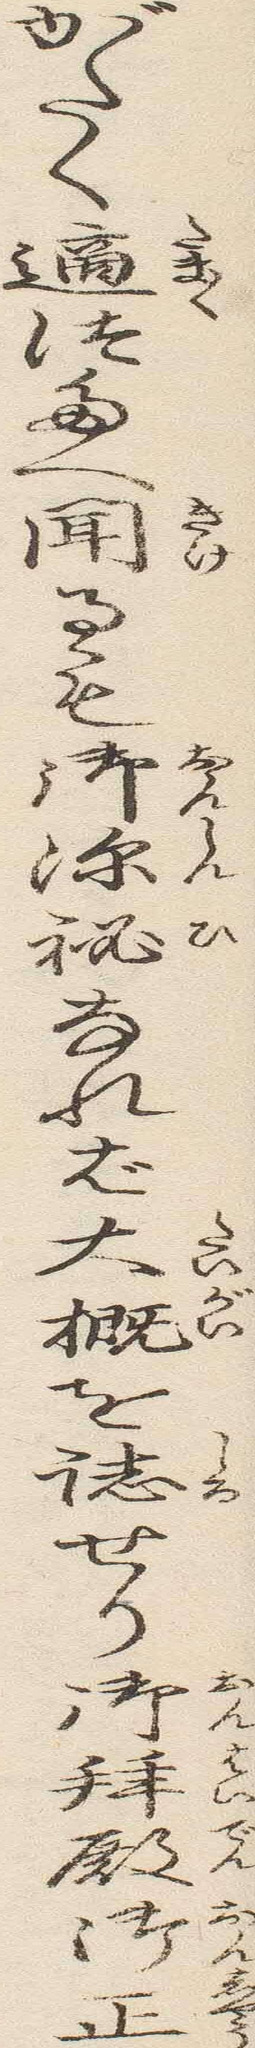がたく適つたへ聞るも御深秘なれば大概を誌せり御拜殿御正
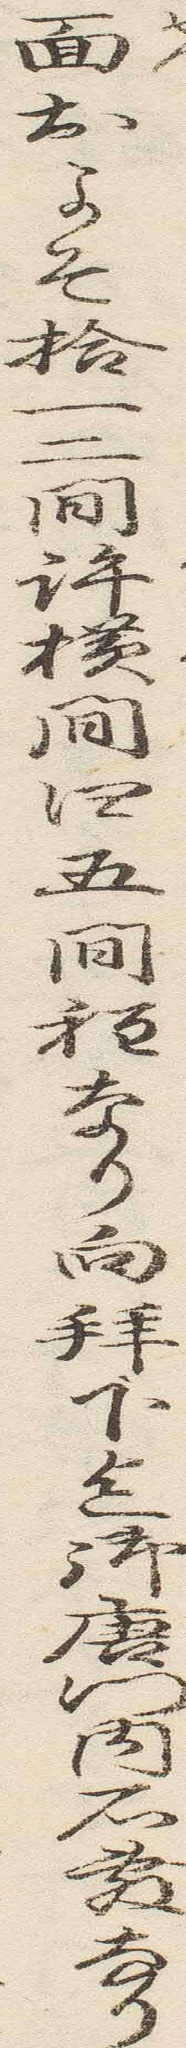面およそ拾一二間許横間四五間程なり向拜下迄御唐門内石敷なり
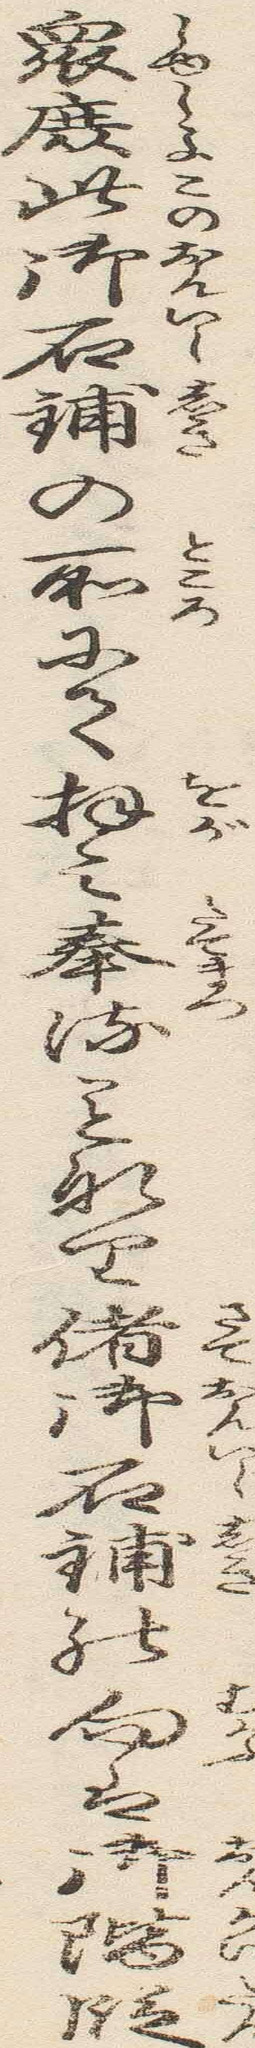衆庻此御石鋪の所にて拝み奉ることなり偖御石鋪の向は御階段
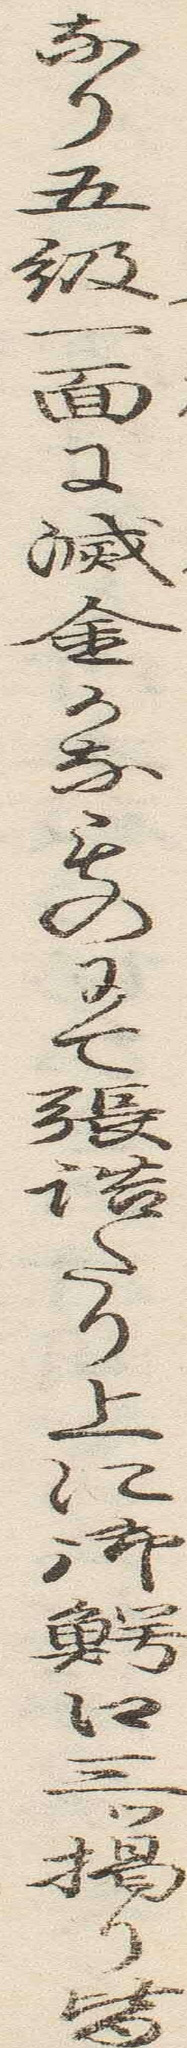なり五級一面に滅金かなものにて張詰たり上に御鰐口三ッ掲り皆
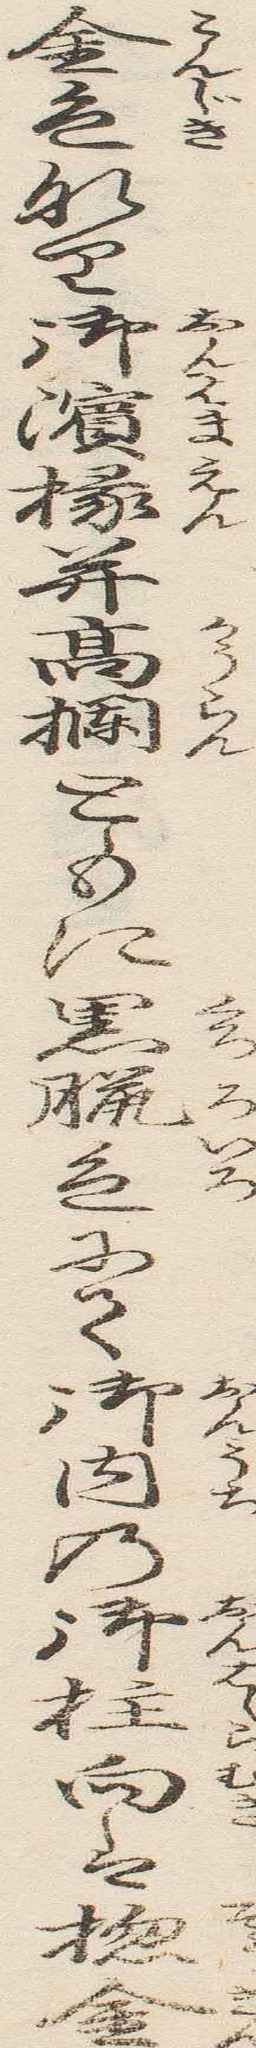金色なり御濵椽并髙欄ともに黒色にて御内の御柱向は揔金
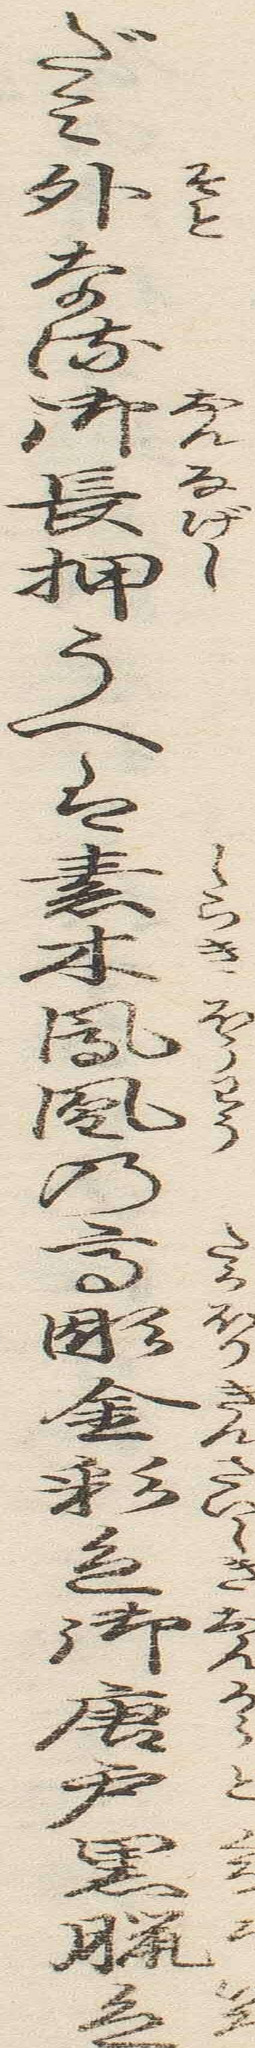だみ外なる御長押うへは素木鳳凰の高彫金彩色御唐戸黒色
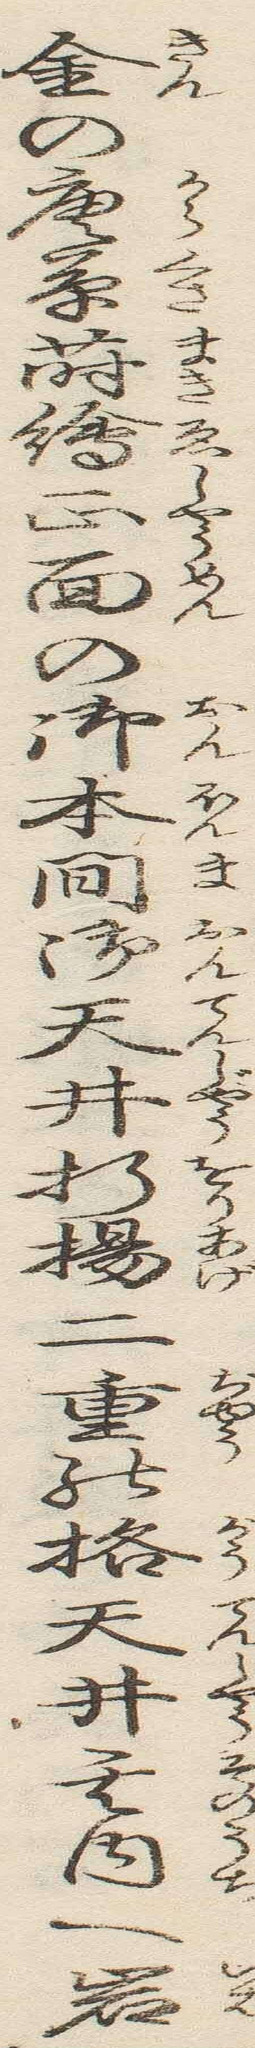金の唐草蒔繪正面の御本間御天井折揚二重の格天井其内へ岩
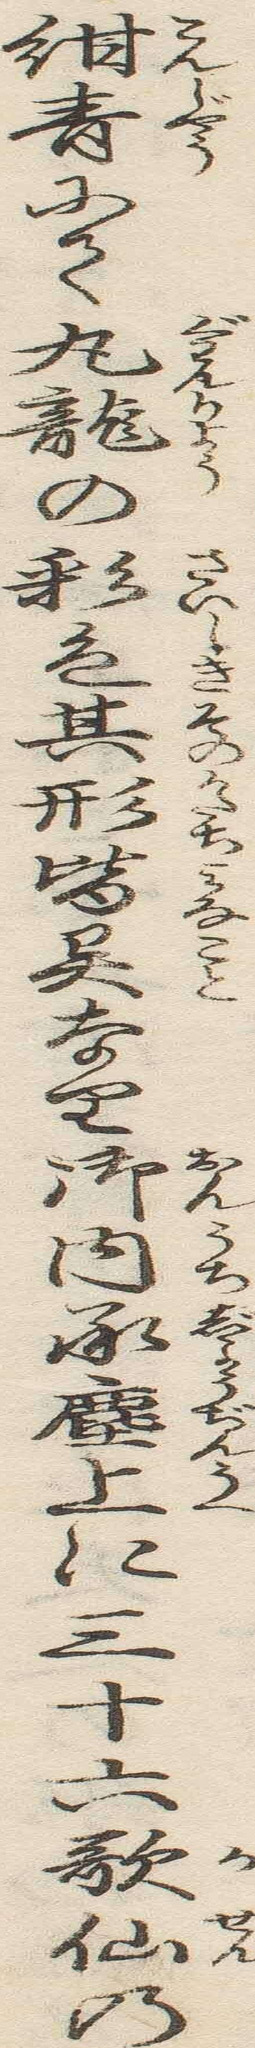紺青にて丸龍の彩色其形皆異なり御内承塵上に三十六歌仙の
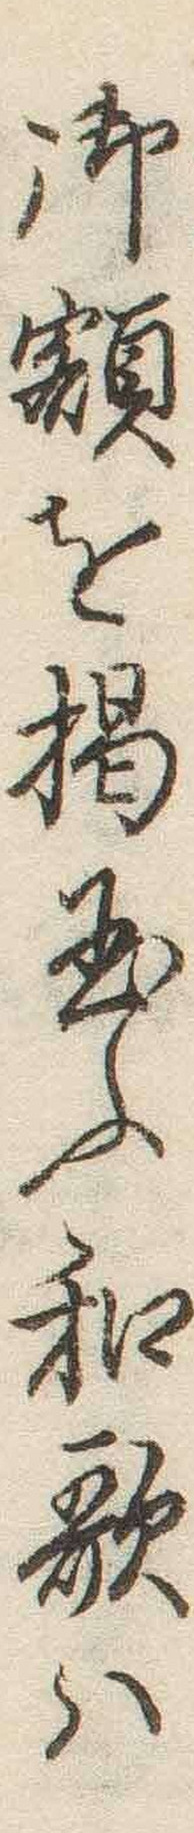御額を掲玉ふ和歌は
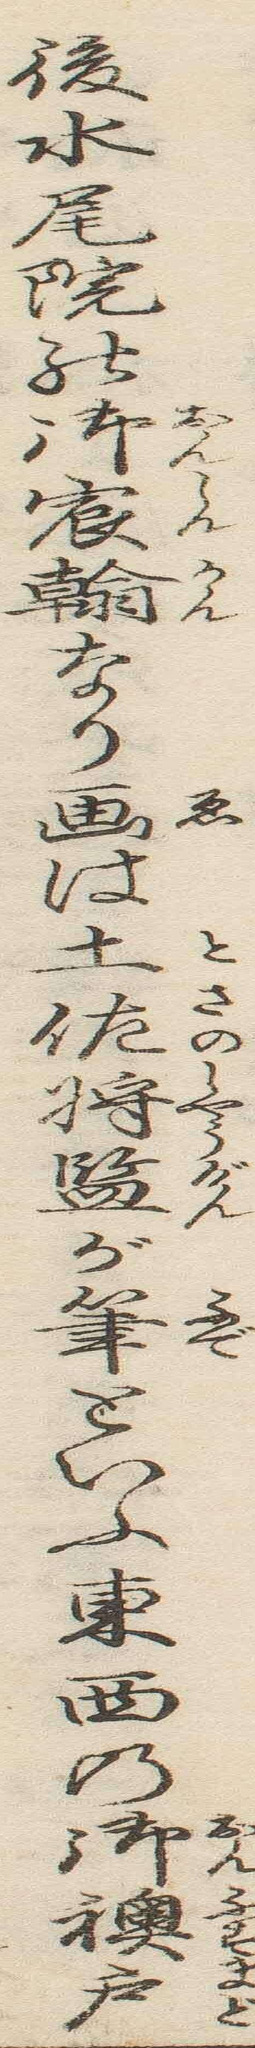後水尾院の御宸翰なり画は土佐将監が筆といふ東西の御襖戸
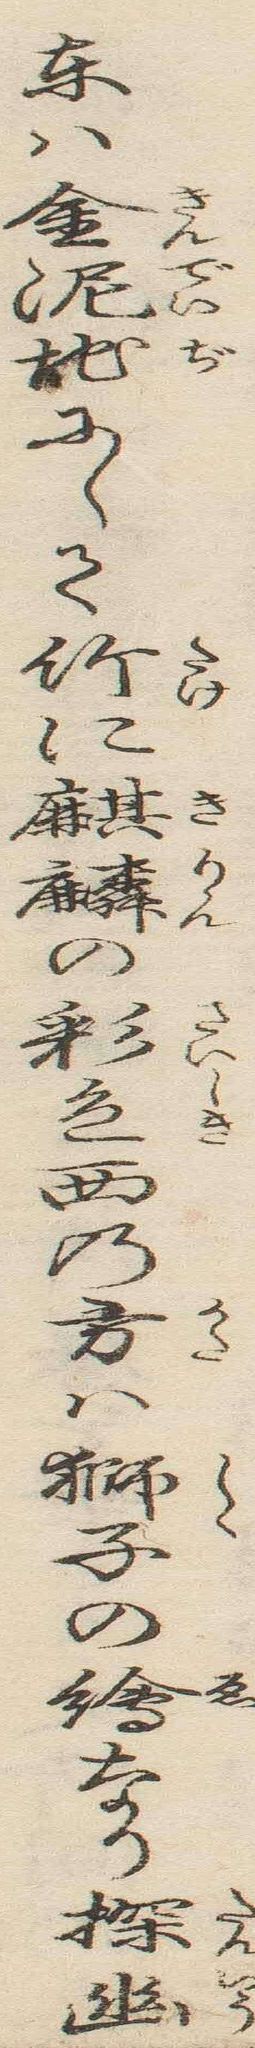東は金泥地にして竹に麒麟の彩色西の方は獅子の繪なり探幽
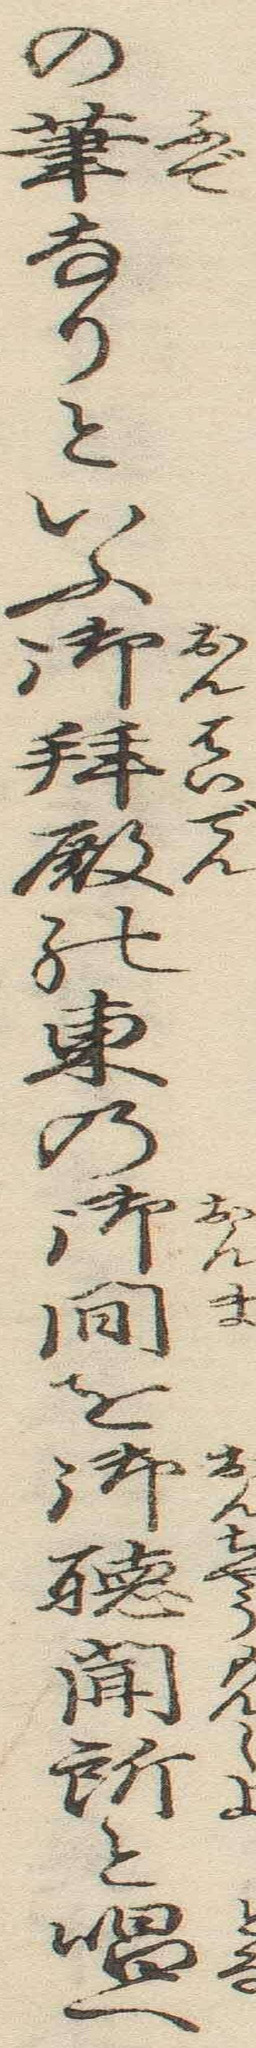の筆なりといふ御拜殿の東の御間を御聴聞所と唱へ

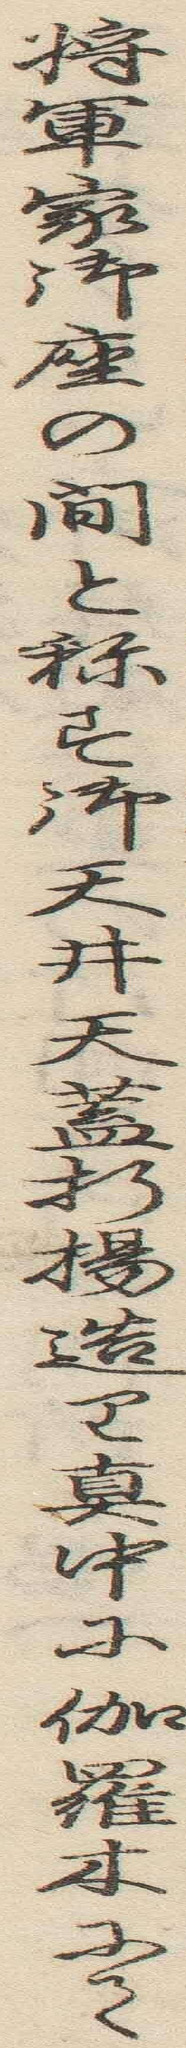将軍家御座の間と称す御天井天蓋折揚造り真中に伽羅木にて
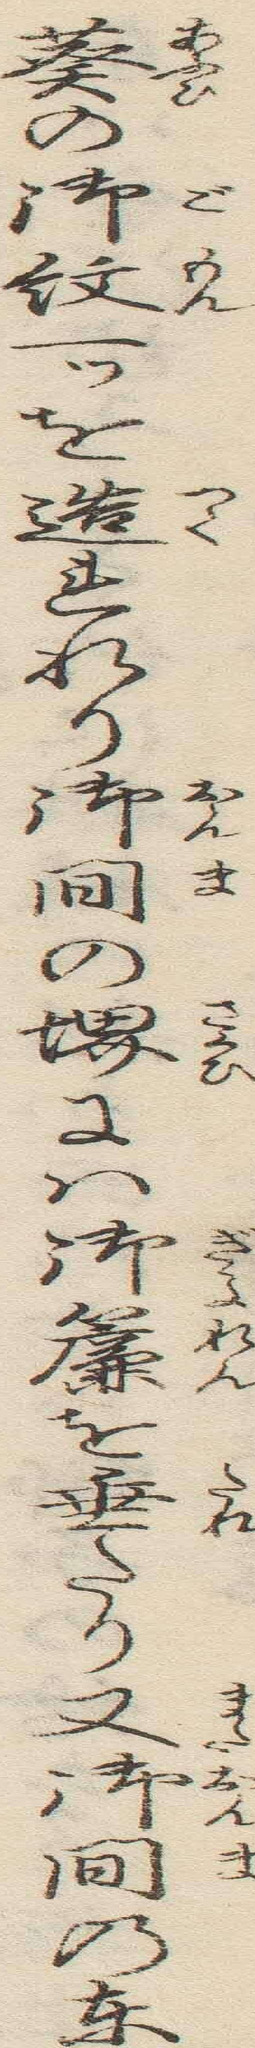葵の御紋一ッを造れれり御間の堺には御簾を垂たり又御間の東
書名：日光山志
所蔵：東京学芸大学附属図書館 国文学研究資料館
